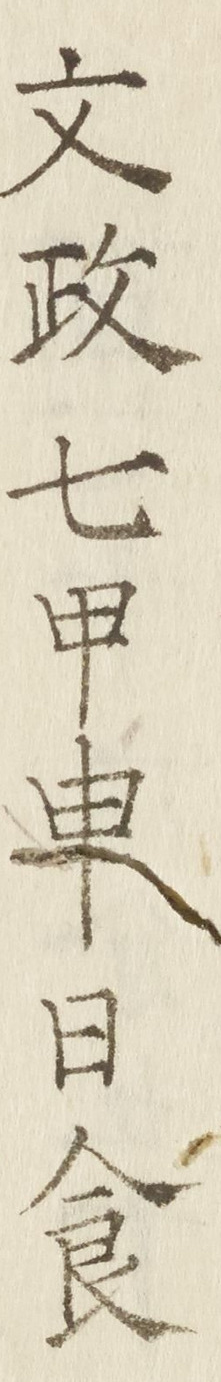文政七甲申日食
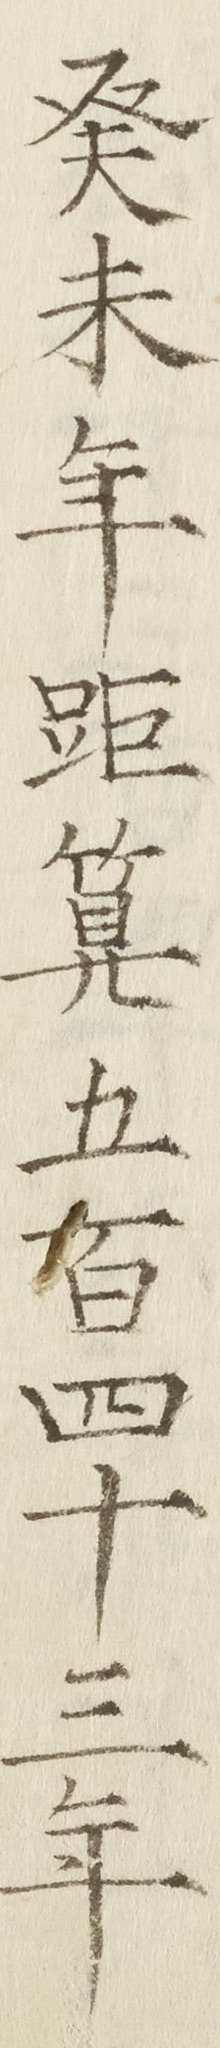癸未年距算五百四十三年
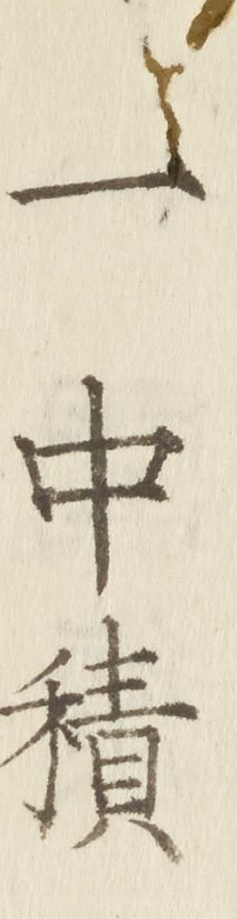一中積
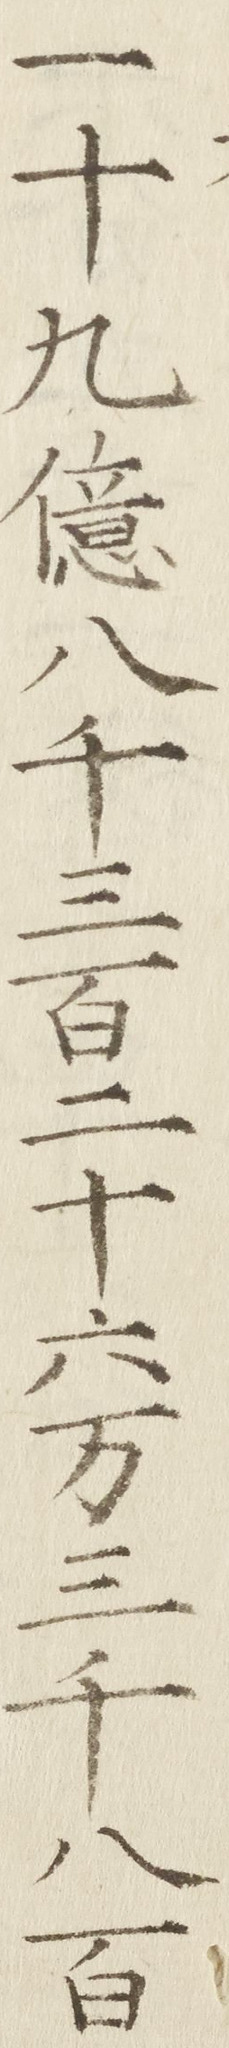一十九億八千三百二十六万三千八百
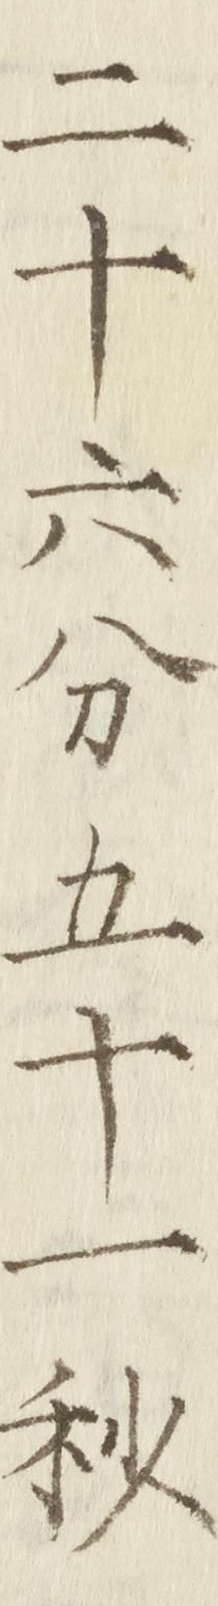二十六分五十一秒
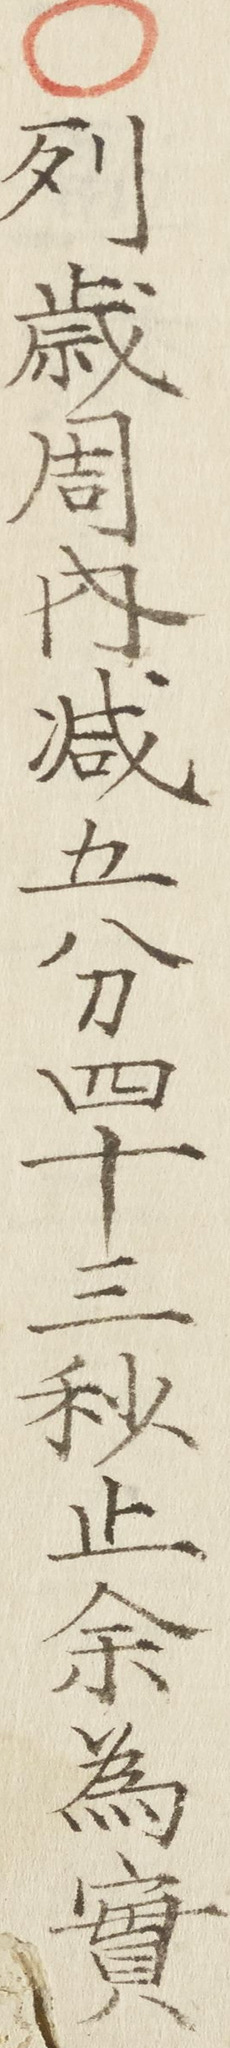○列歳周内減五分四十三秒止余為実
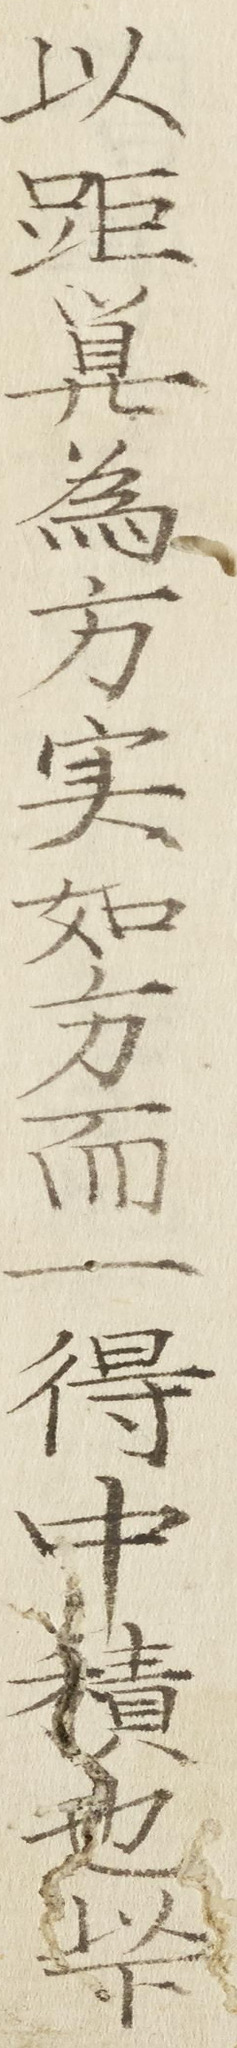以距算為方実如方而一得中積也以下

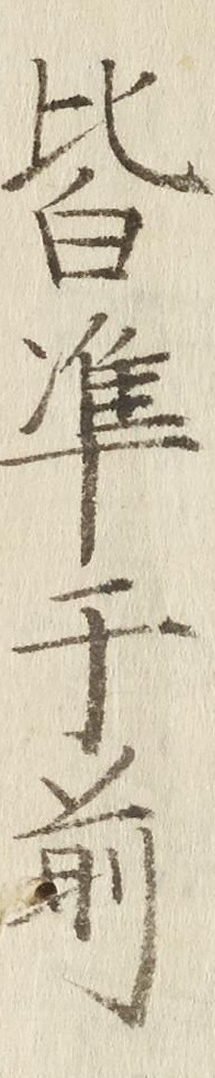皆準于前
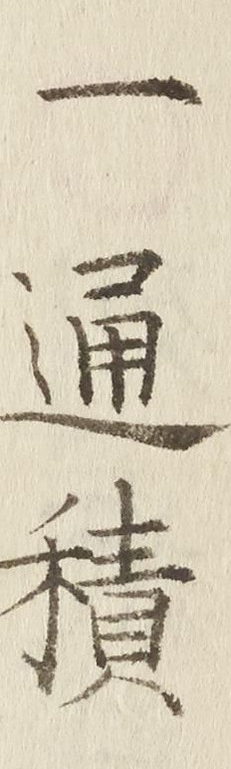一通積
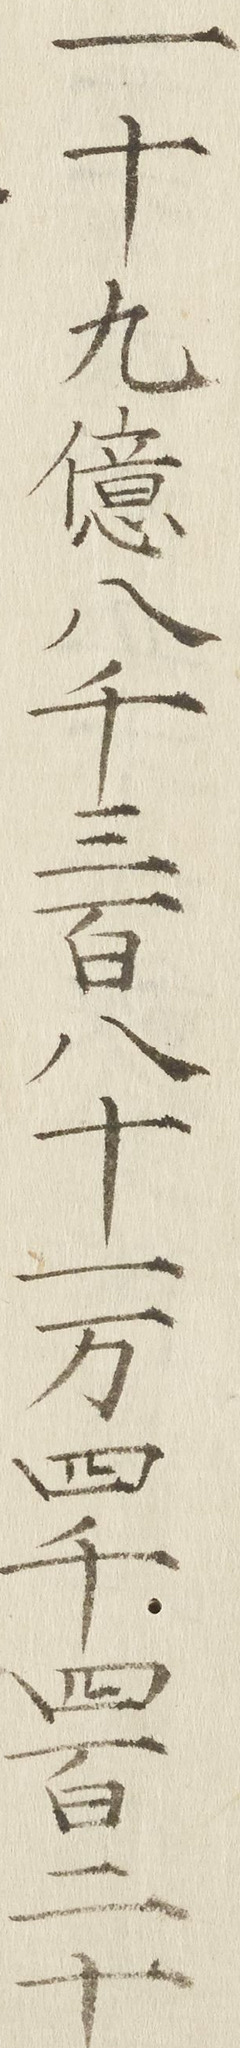一十九億八千三百八十一万四千四百二十
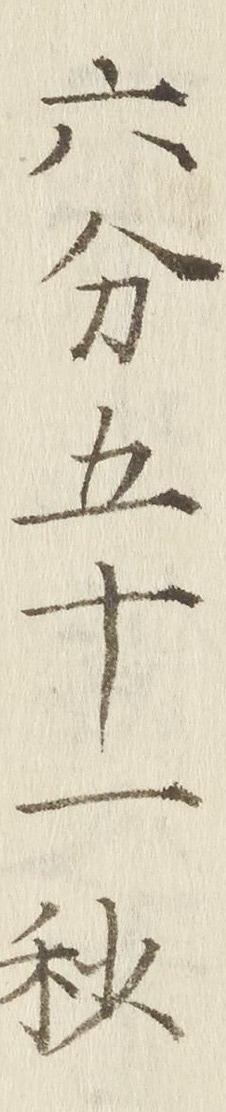六分五十一秒
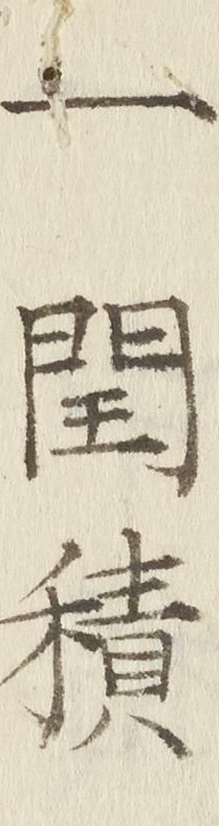一閏積
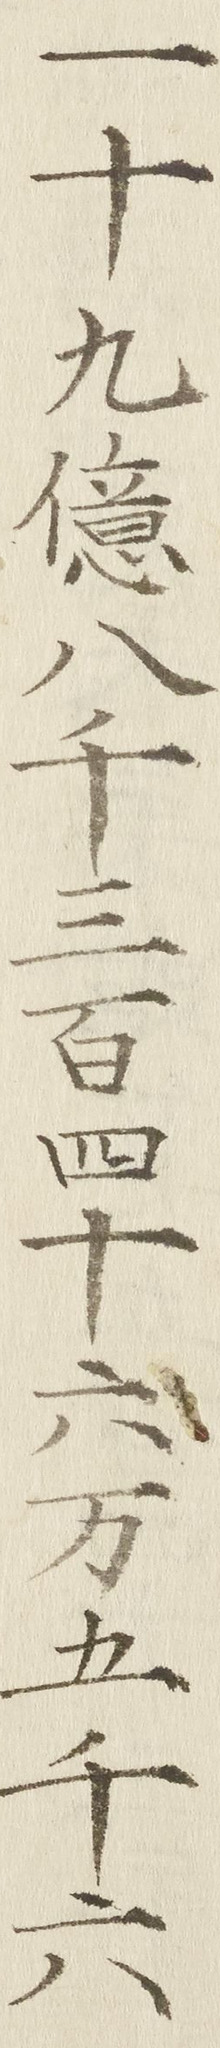一十九億八千三百四十六万五千六
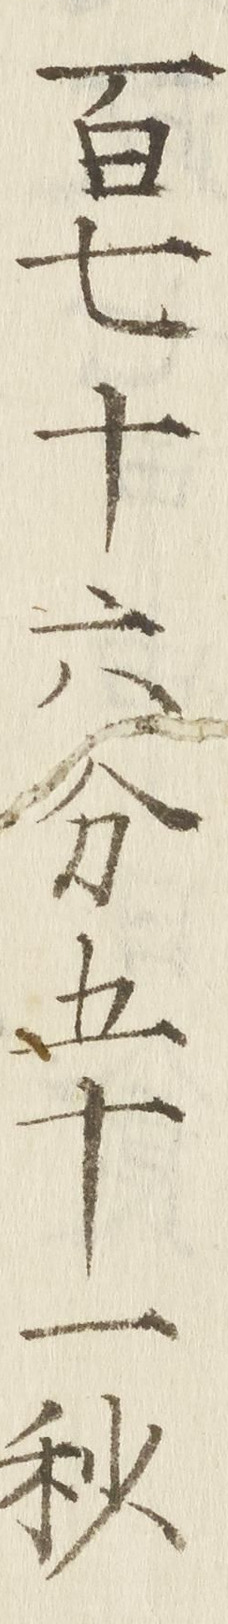百七十六分五十一秒
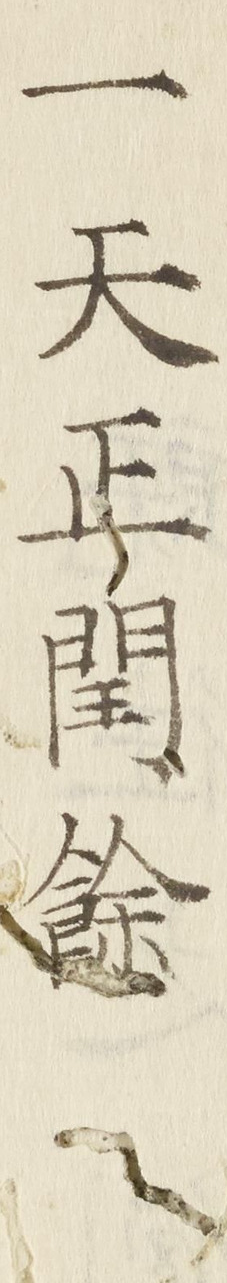一天正閏餘
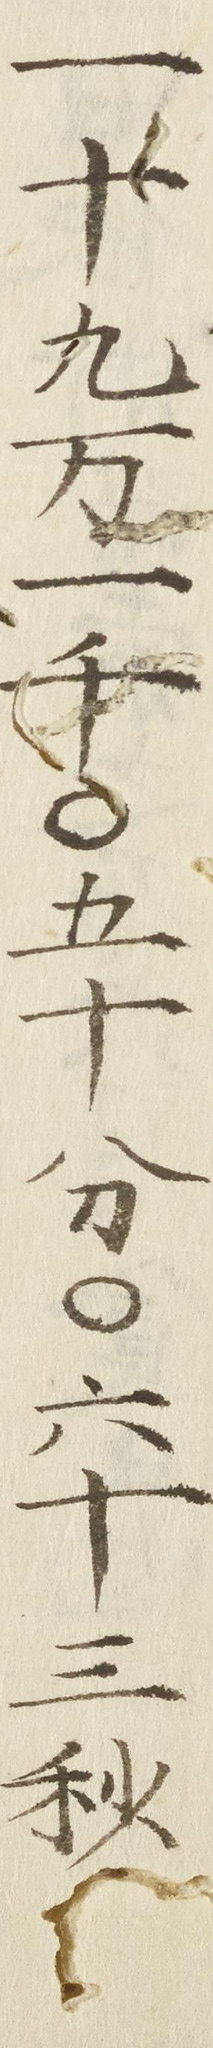一十九万一千〇五十分〇六十三秒
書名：日食度
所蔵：東京大学地震研究所図書室 Earthquake Research Institute Library, The University of Tokyo, JAPAN
